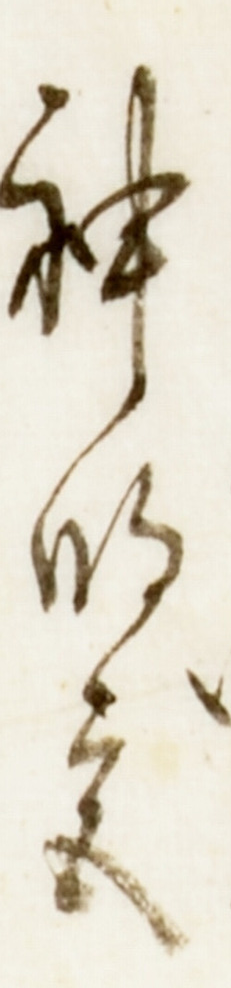神明宮
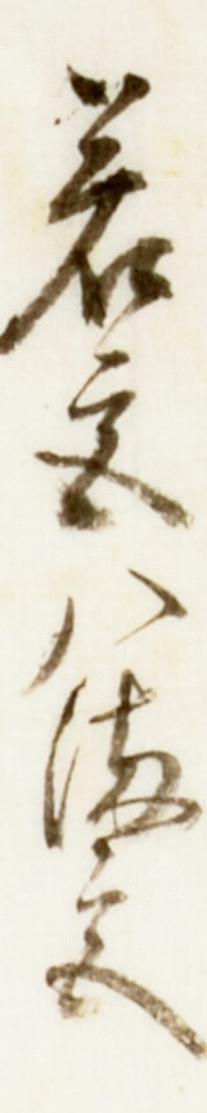若宮八満宮
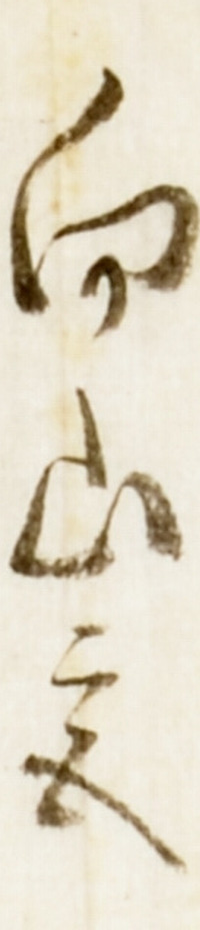向山宮
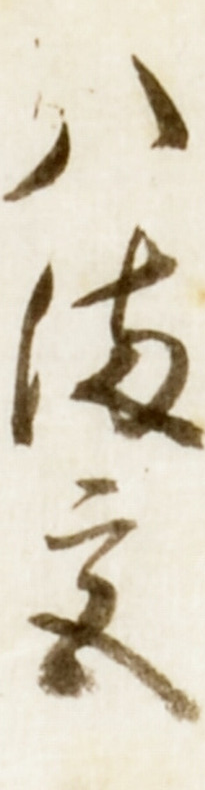八満宮
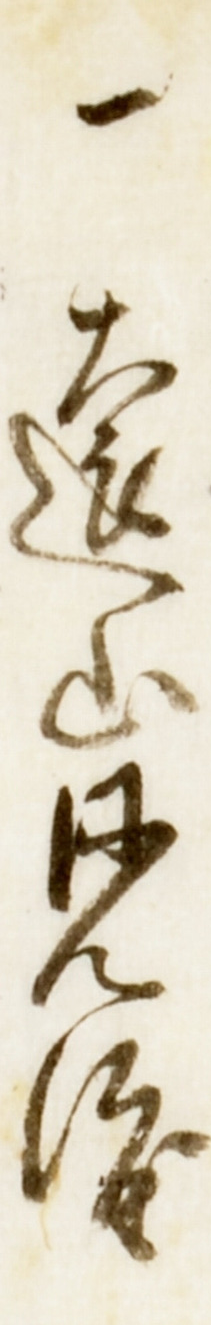一遠山見渡
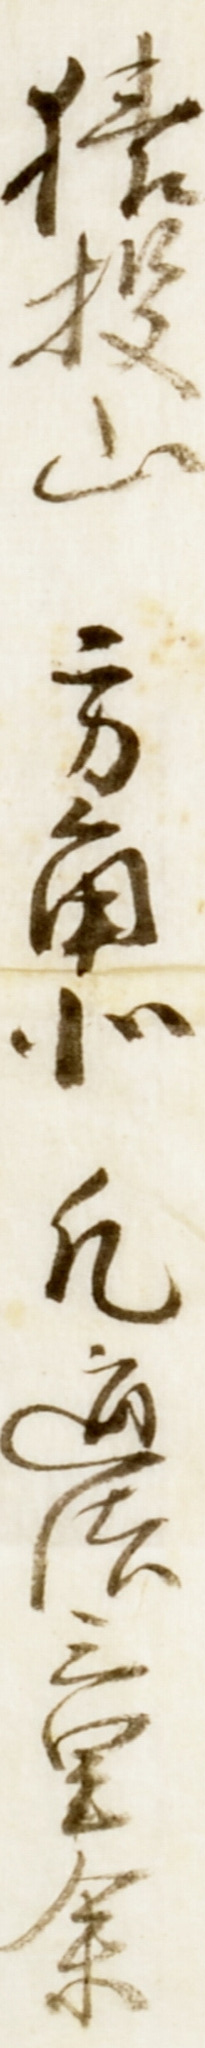猿投山方角北凡道法三里余
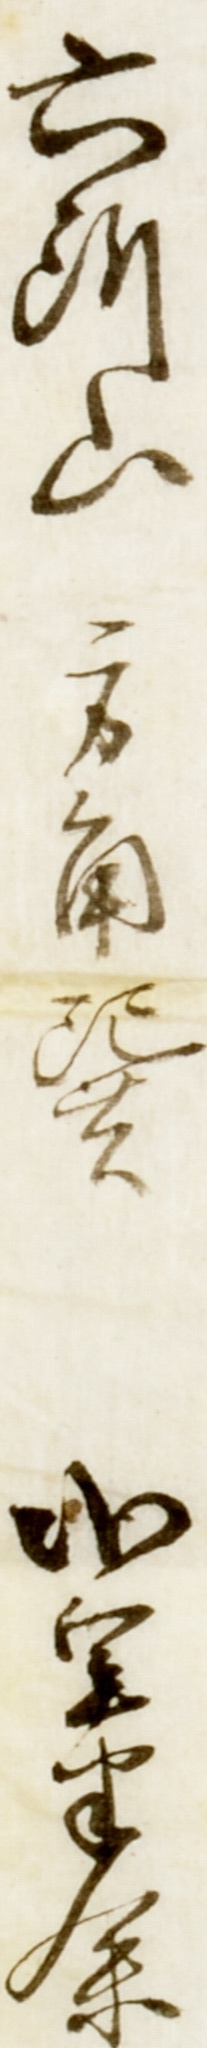六所山方角巽弐里半余
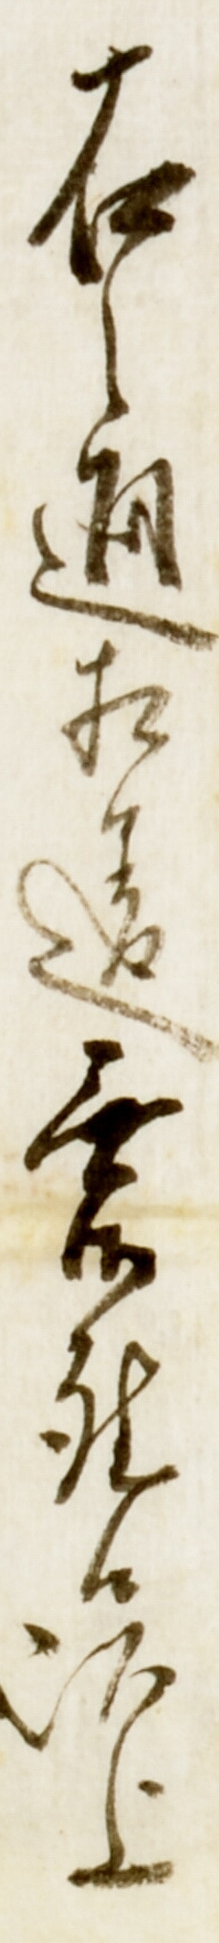右之通相違無御座候以上
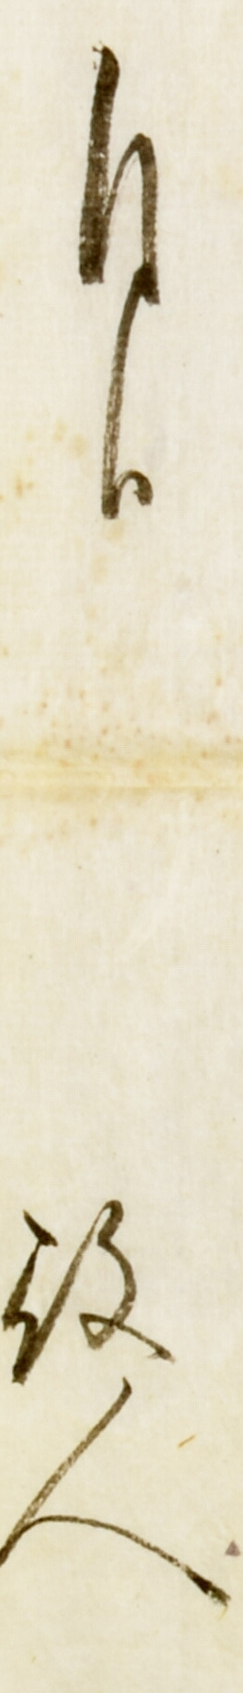月日役人
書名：書上（控）
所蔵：伊那市立高遠町図書館・合同会社AMANE
